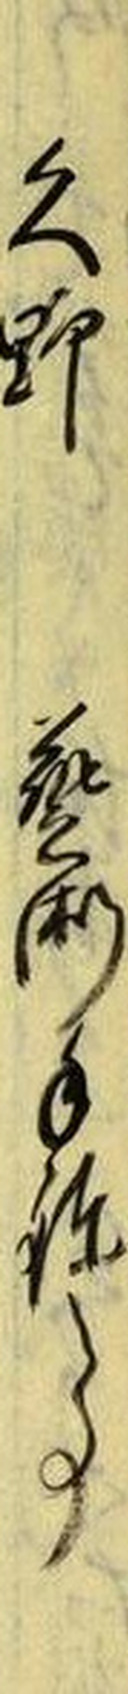久野芸術手錬之事
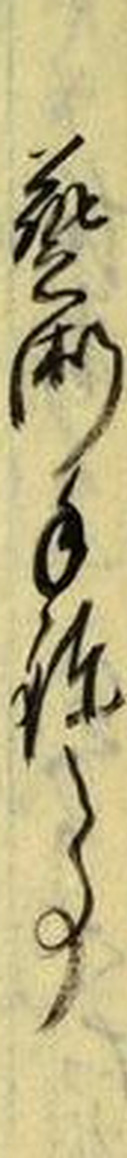久野芸術手錬之事
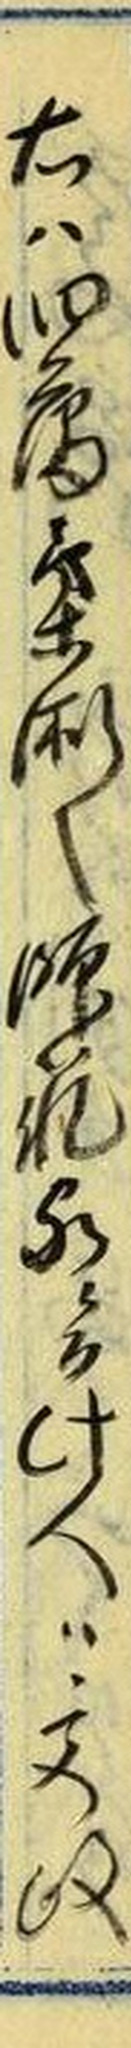右ハ旧藩柔術之師範家ニ而此人ハ文政
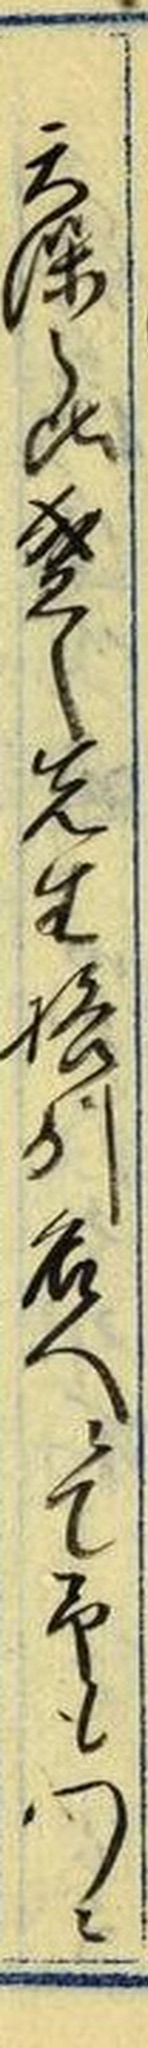天保之比盛し先生格別名人ニて予も門ニ
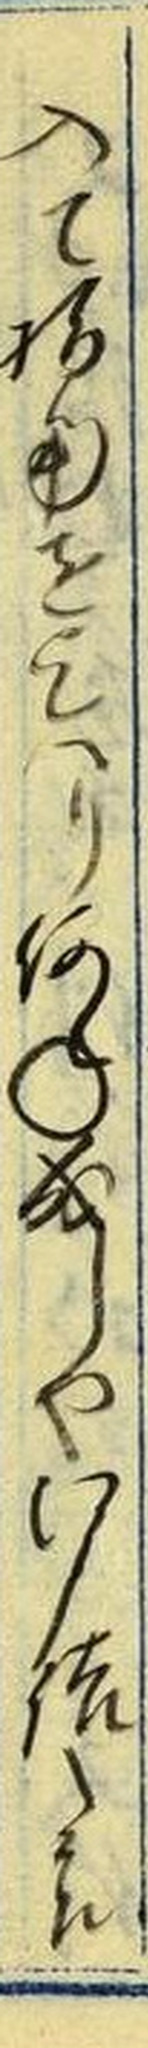入て指南を乞へり何年成しや江戸詰之節
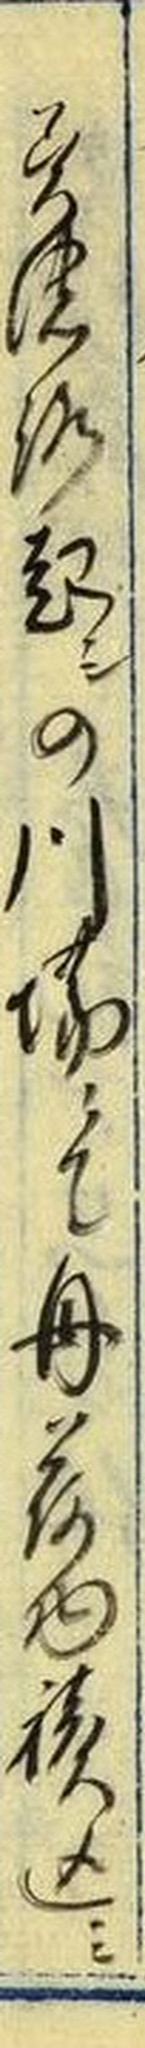美濃路起しの川場ニて舟荷物積込ミ
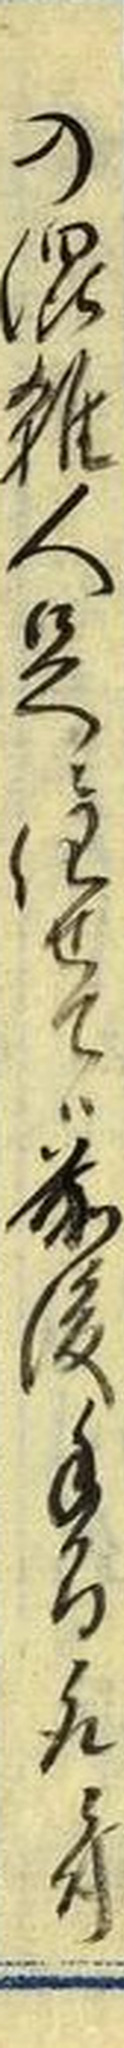の混雑人足ニ任せてハ前後手間取ニ付
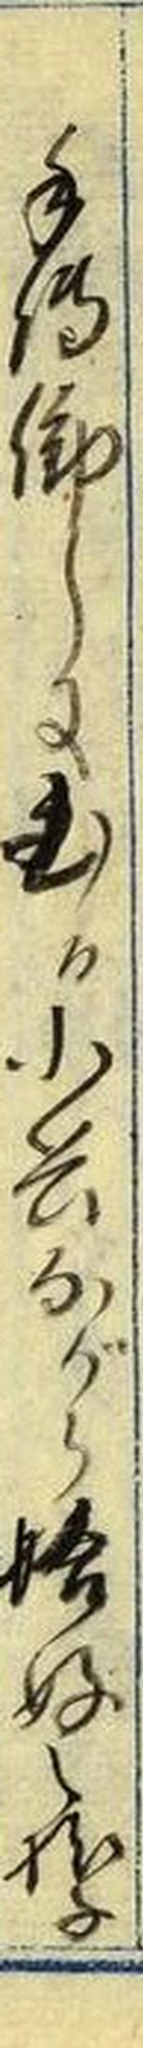手伝働しに至而小兵ながら恰好之様子
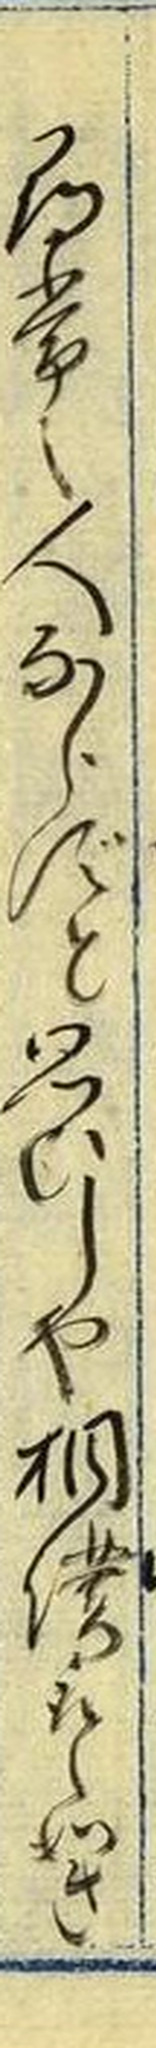尋常之人ならずと思いしや相撲取之如き
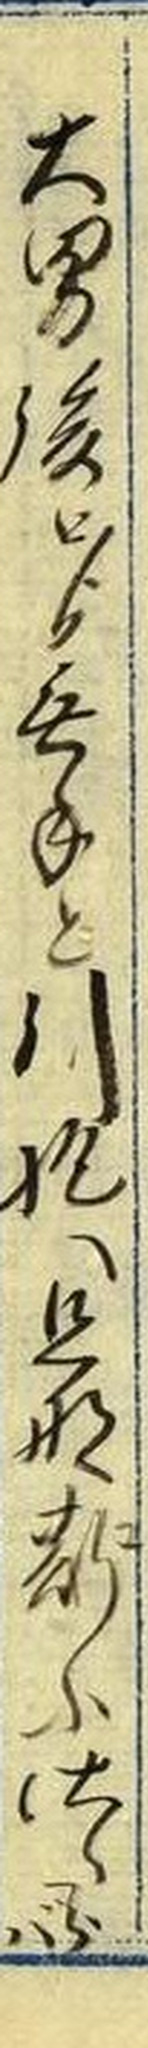大男後ろゟ無手と引抱へ旦那斯ふ仕たらバ
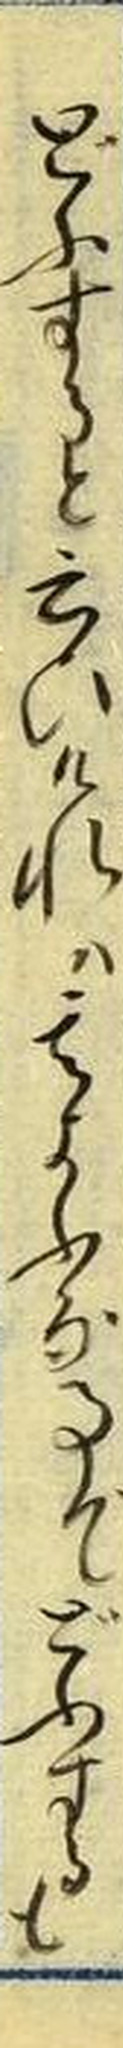どふすると云いけれハ其よふな事でどふするも
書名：温古集 三巻
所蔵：福井県文書館 Fukui Prefectural Archives
